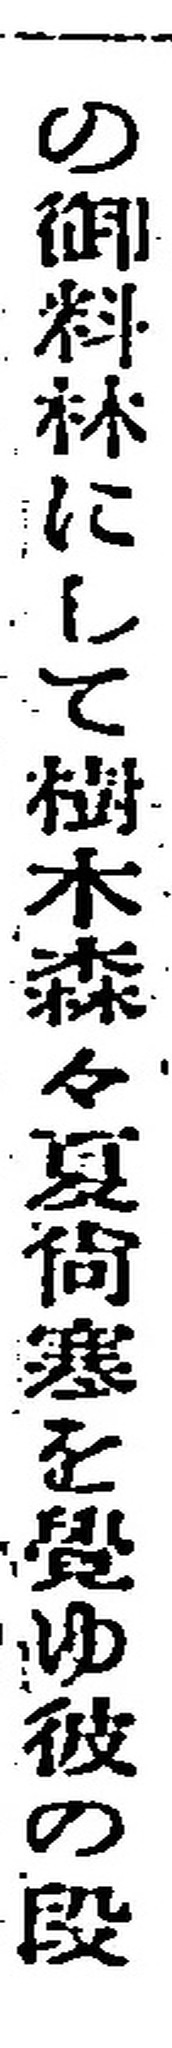の御料林にして樹木森々夏尚寒を覚ゆ彼の段
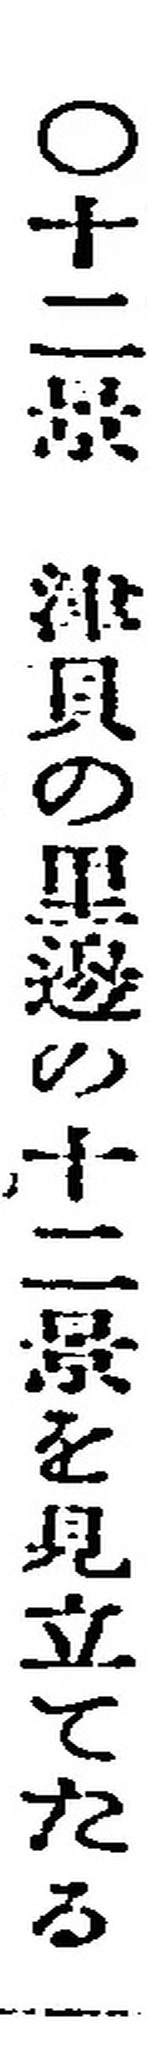○十二景津貝の里辺の十二景を見立てたる
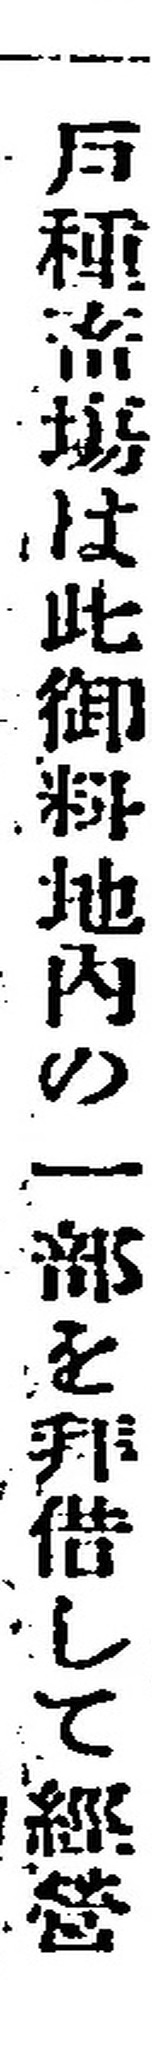戸種畜場は此御料地内の一部を拝借して経営
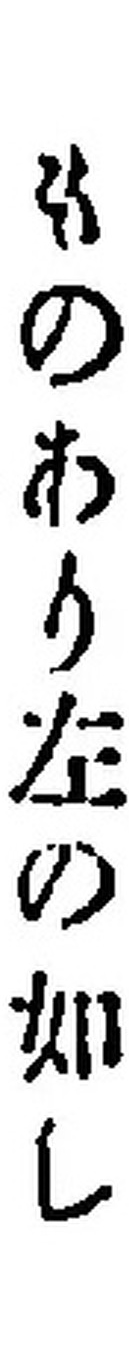ものあり左の如し
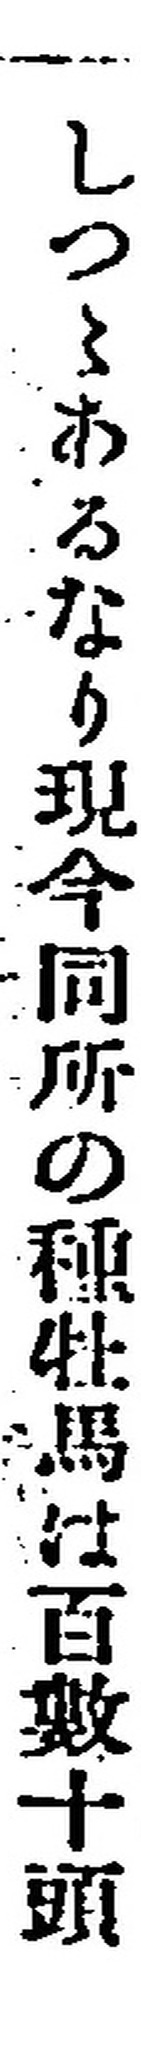しつゝあるなり現今同所の種牡馬は百数十頭
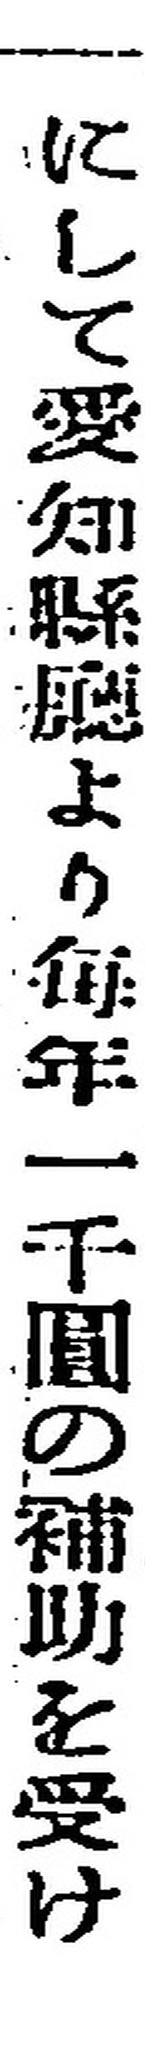にして愛知県庁より毎年一千円の補助を受け
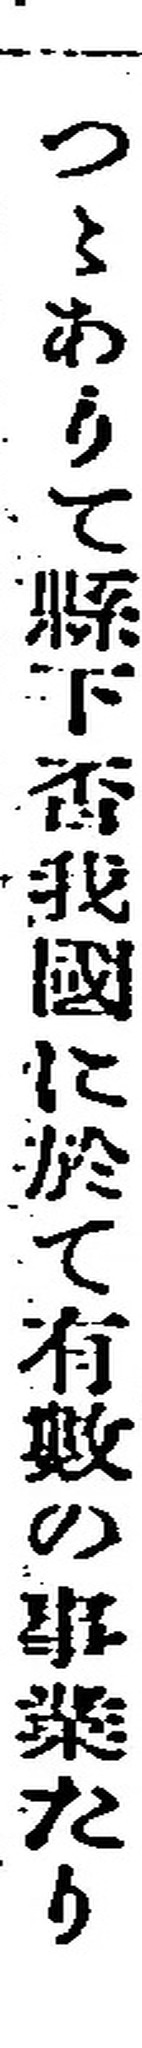つゝありて県下否我国に於て有数の事業たり
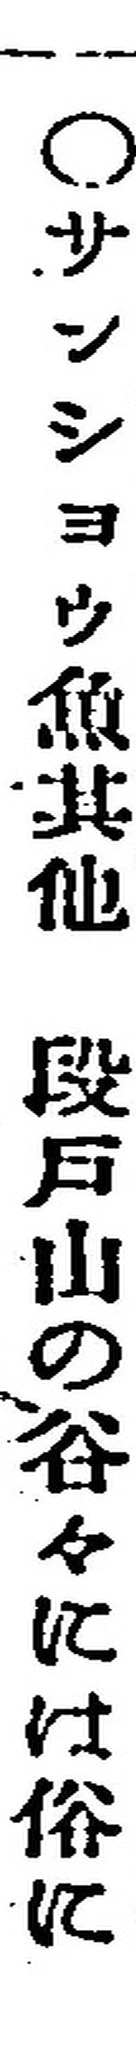○サンショウ魚其他段戸山の谷々には俗に
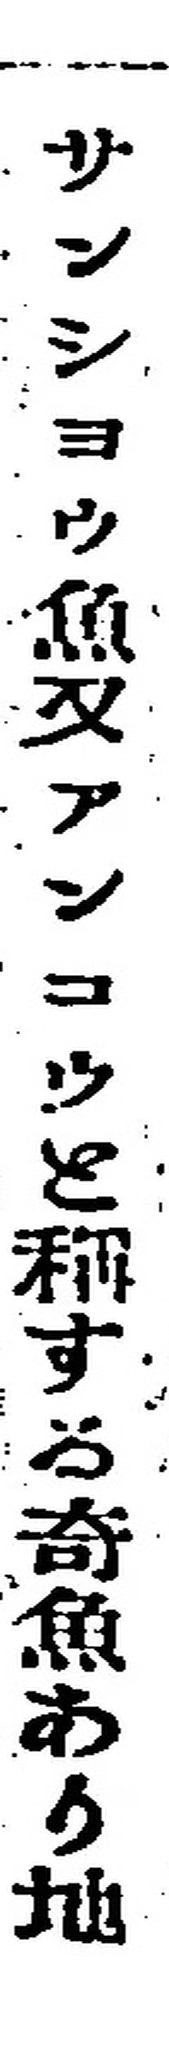サンシヨウ魚又アンコウと称する奇魚あり地
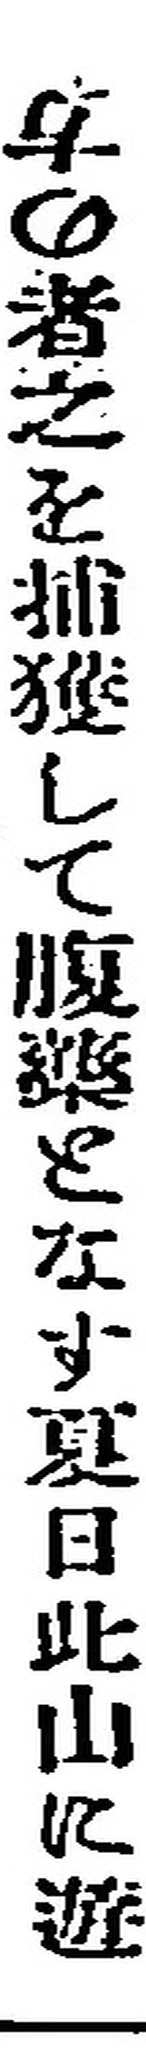方の者之を捕獲して腹薬となす夏日此山に遊
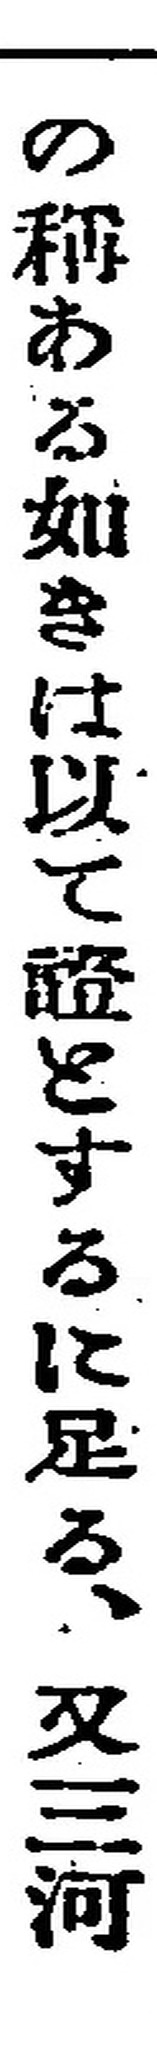の称ある如きは以て証とするに足る、又三河
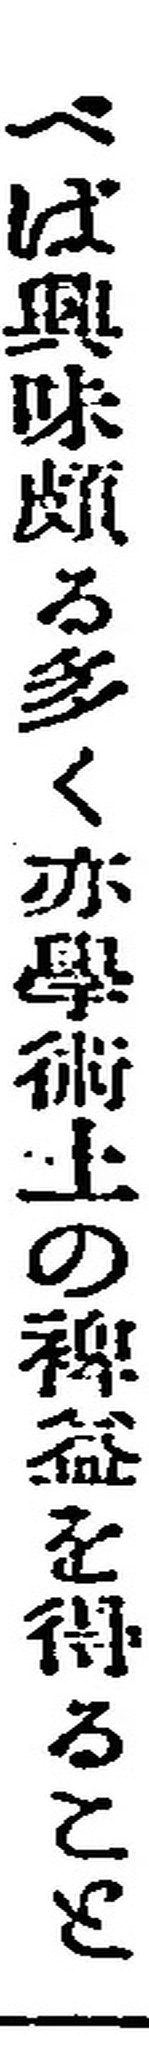べば興味頗る多く亦学術上の裨益を得ること
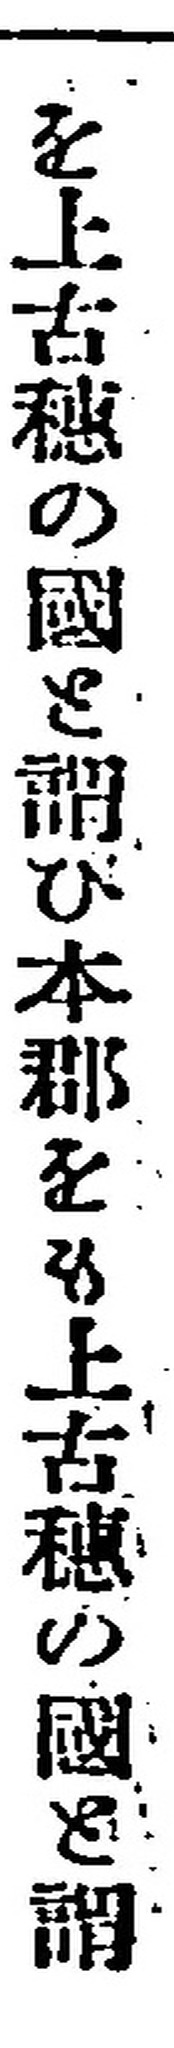を上古穂の国と謂ひ本郡をも上古穂の国と謂
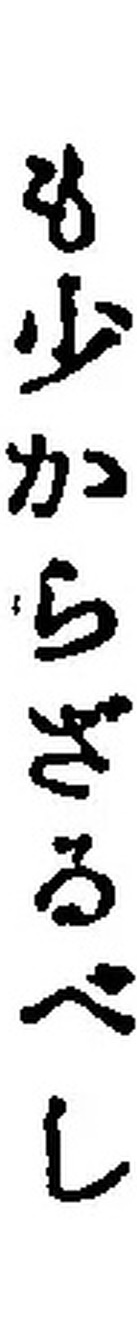も少からざるべし
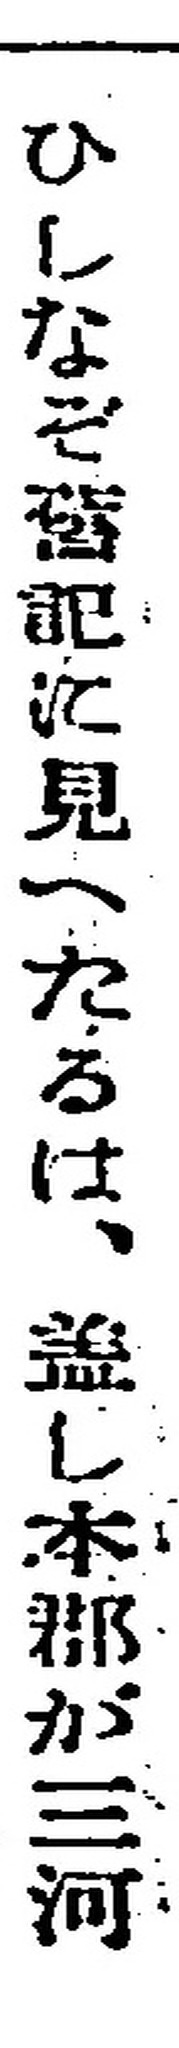ひしなぞ旧記に見へたるは、蓋し本郡が三河
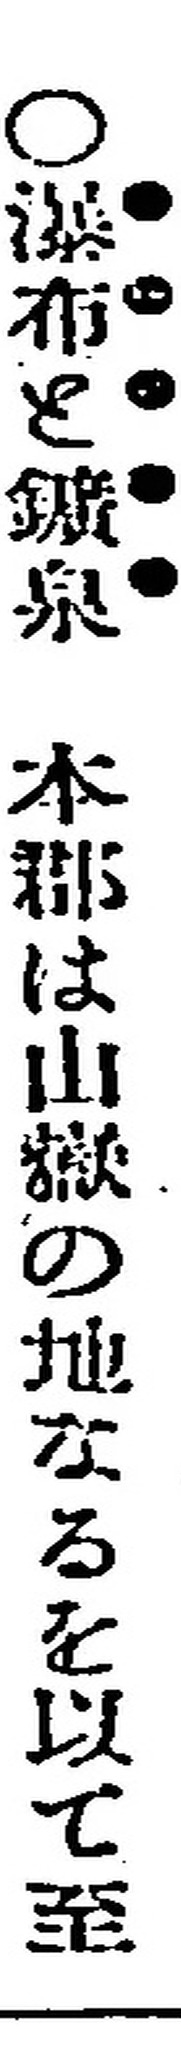○瀑布と鉱泉本郡は山嶽の地なるを以て至
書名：東参名勝案内
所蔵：国立国会図書館 National Diet Library, JAPAN
